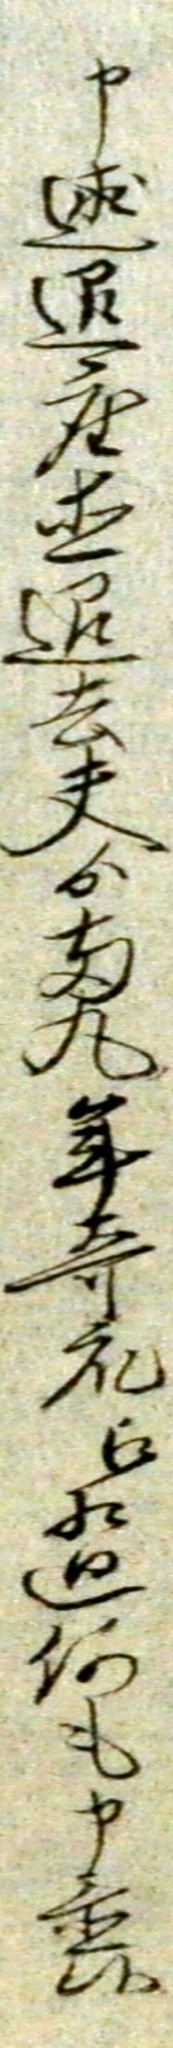申述退座直退去夫ゟ両丸年寄衆江相廻何も申置候
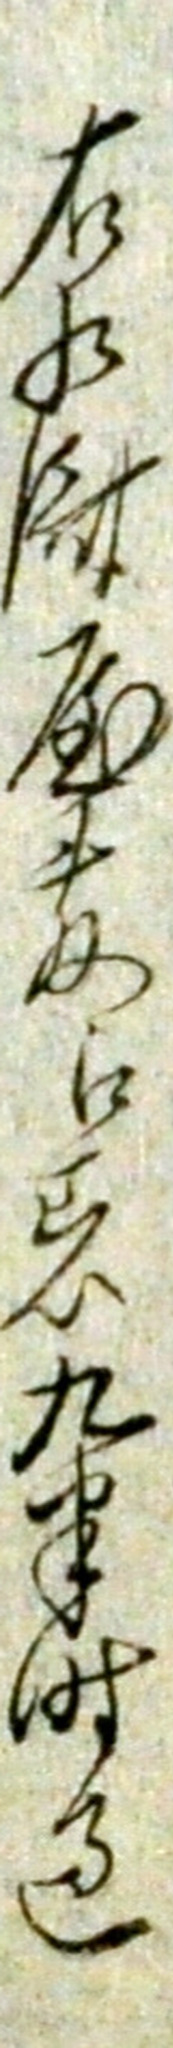右相済屋敷江着九半時過
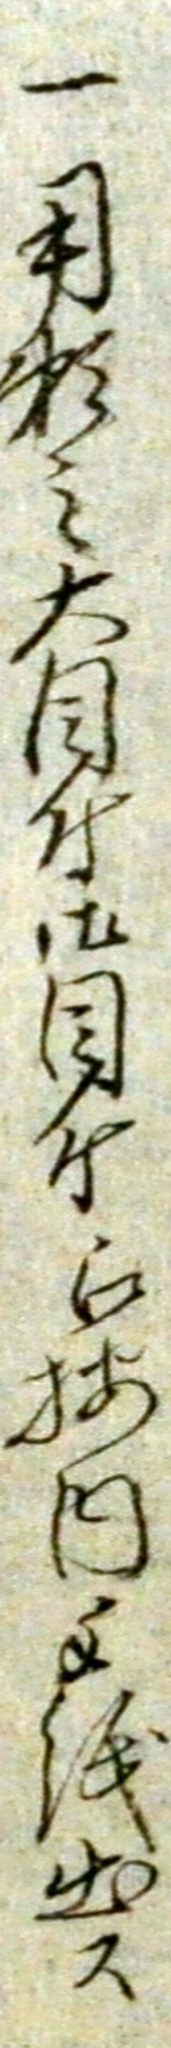一用頼之大目付御目付江按内手紙出ㇲ
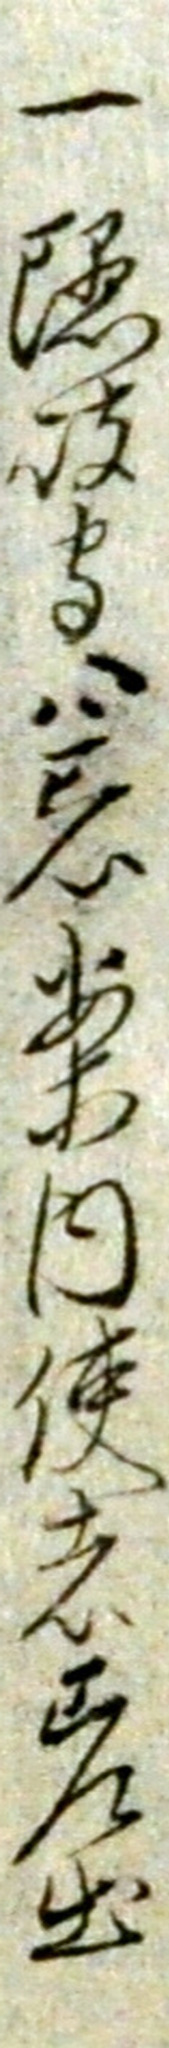一隠岐守へㇵ着案内使者差出
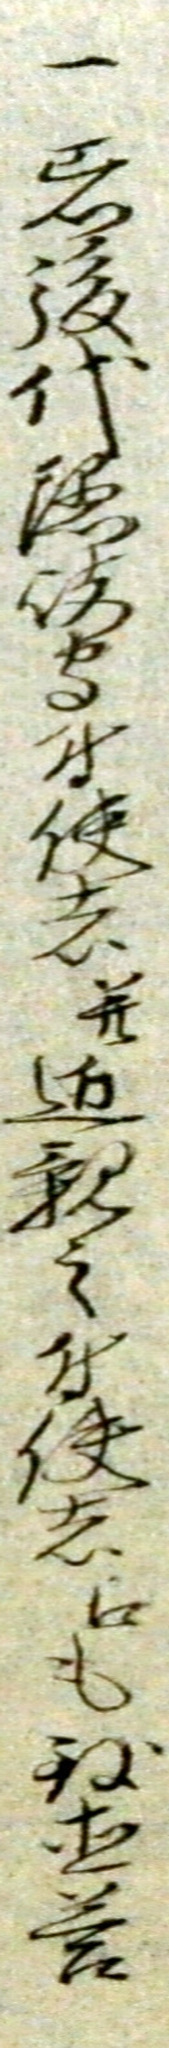一着後代隠岐守付使者幷近親付使者江も致直答
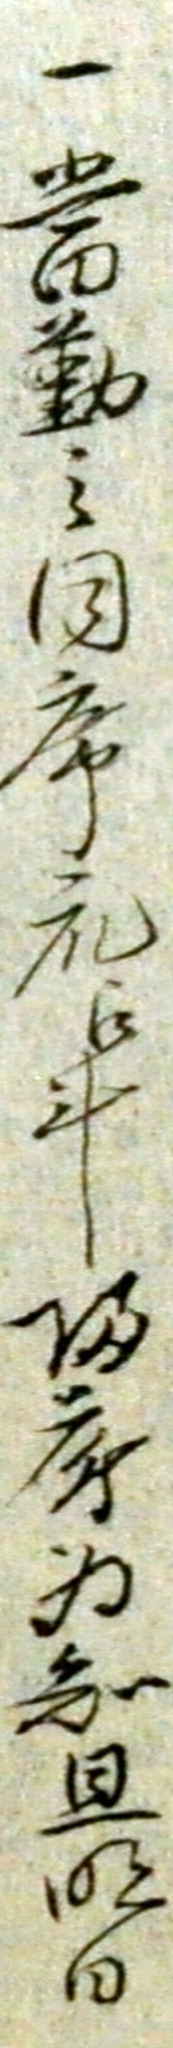一當勤之同席衆江斗帰府為知且明日
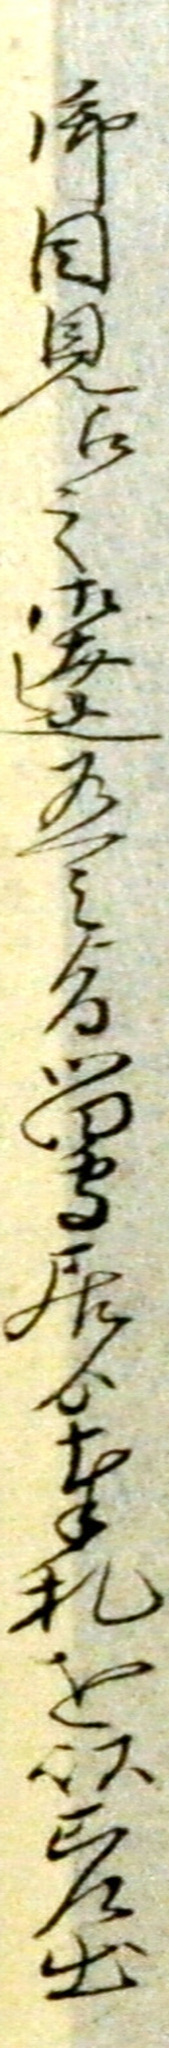御目見江之御達有之旨留守居ゟ奉札を以差出
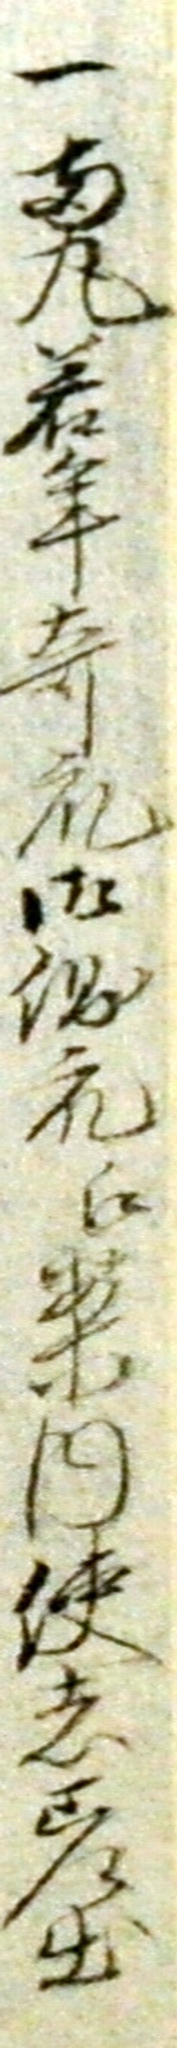一両丸若年衆御側衆江案内使者差出

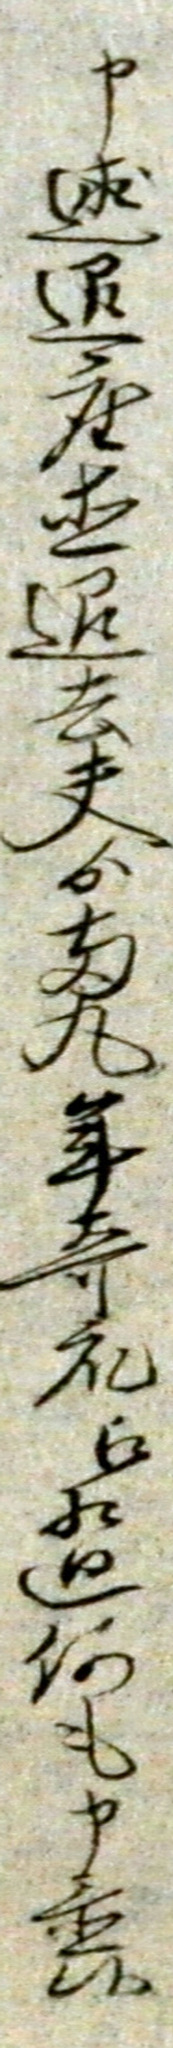申述退座直退去夫ゟ両丸年寄衆江相廻何も申置候
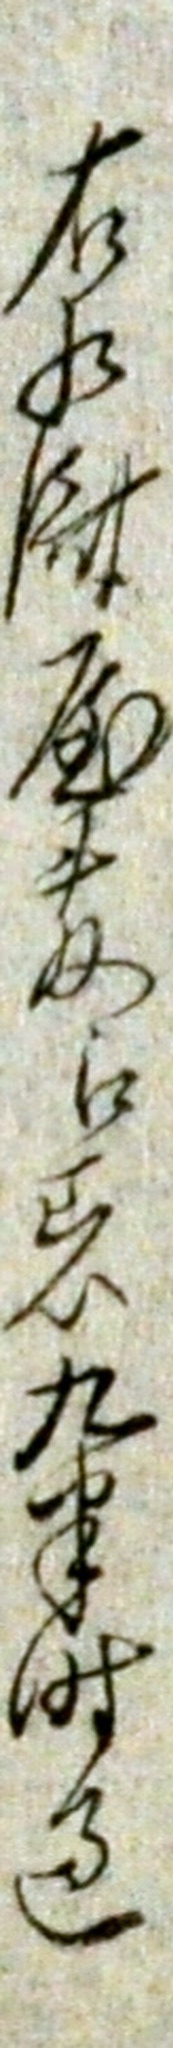右相済屋敷江着九半過
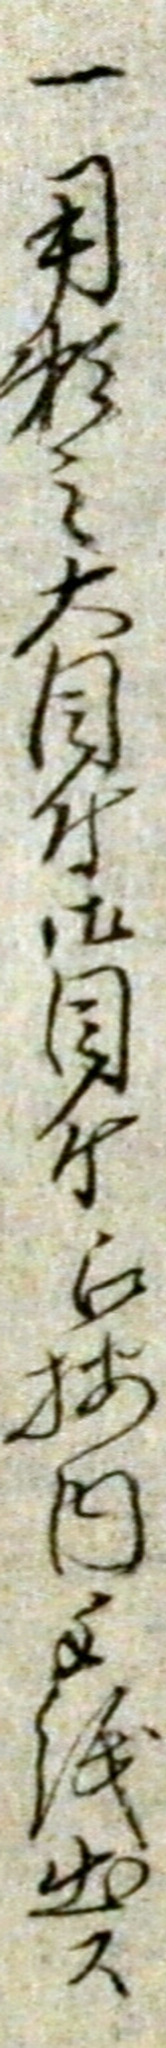一用頼之大目付御目付江按内手紙出ㇲ
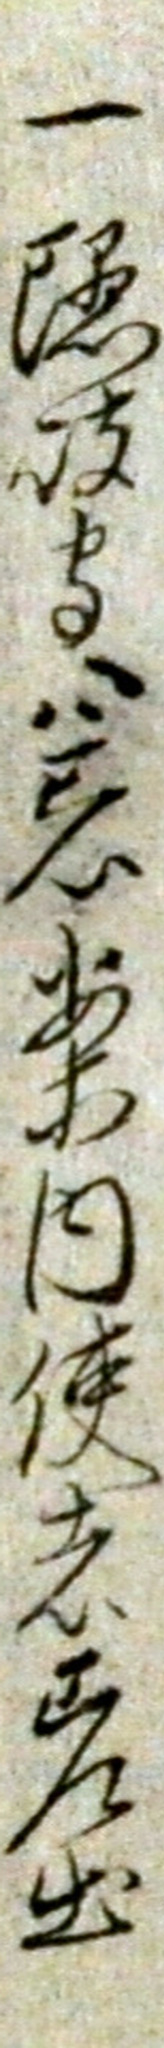一隠岐守へㇵ着案内使者差出
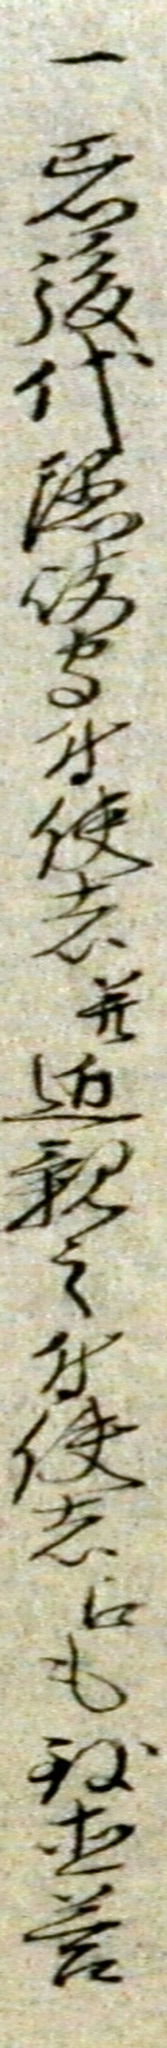一着後代隠岐守付使者幷近親付使者江も致直答
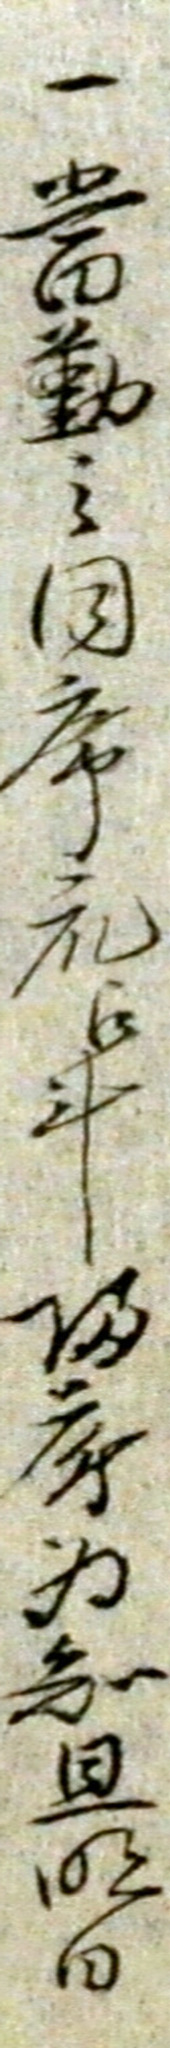一當勤之同席衆江斗帰府為知且明日
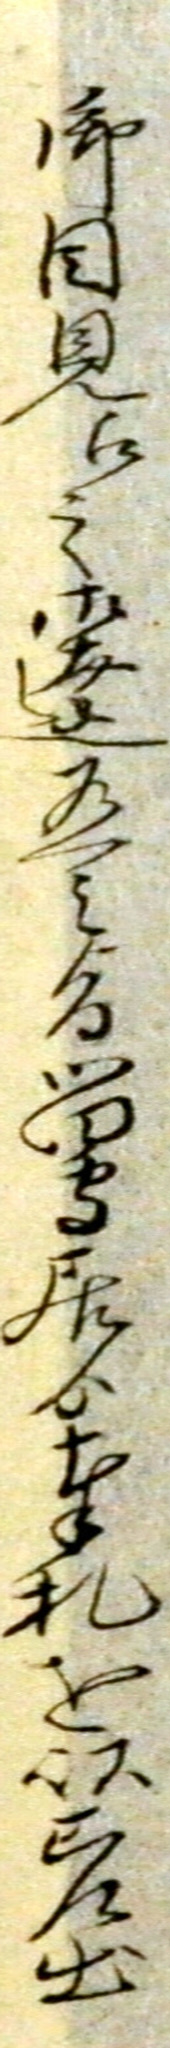御目見江之御達有之旨留守居ゟ奉札を以差出
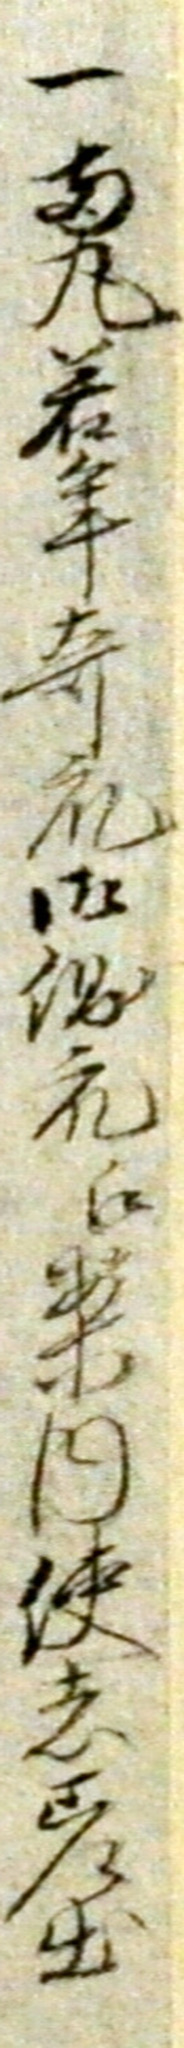一両丸若年寄衆御側衆江案内使者差出
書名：日光御名代相勤候節ノ留
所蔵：伊那市立高遠町図書館・合同会社AMANE
